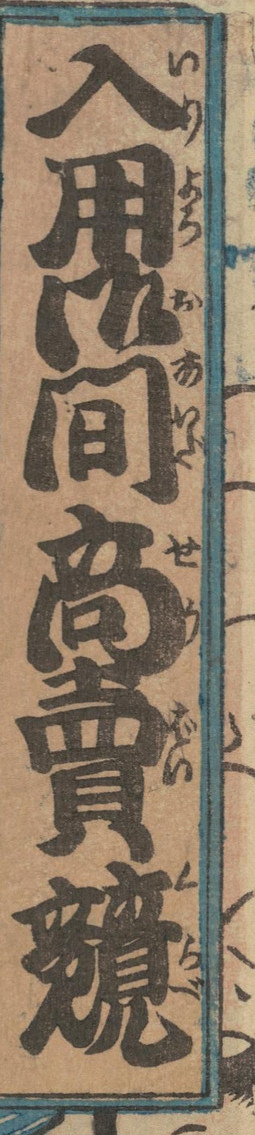入用御間商売競
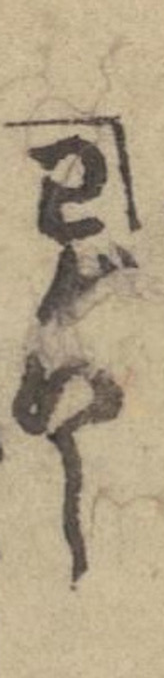〽わがいし
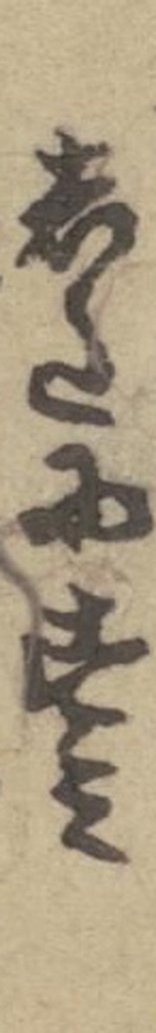したにすみ
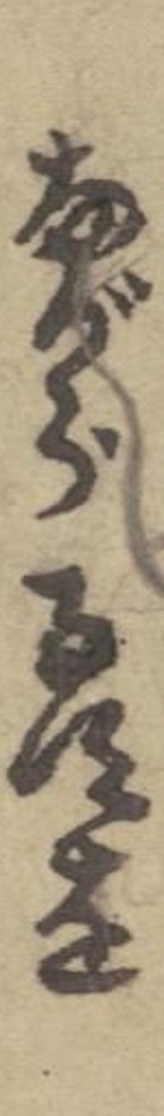ながらるすを
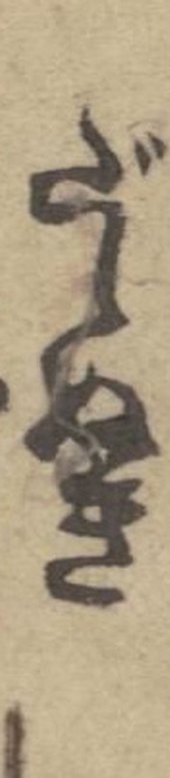だしぬき
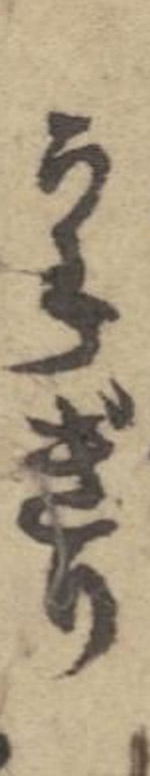うらぎり
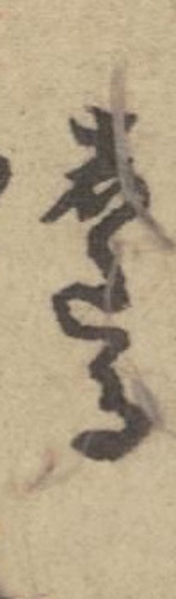したる
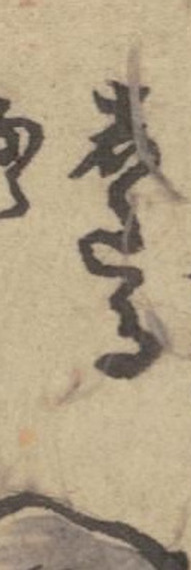したる
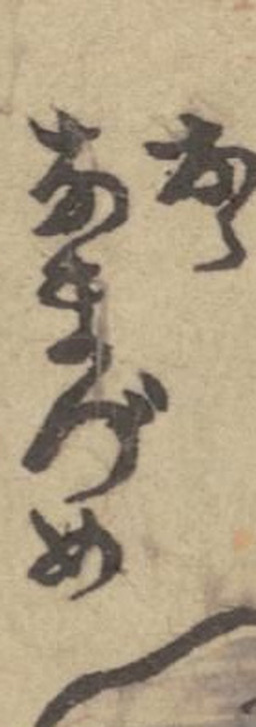なまづめ
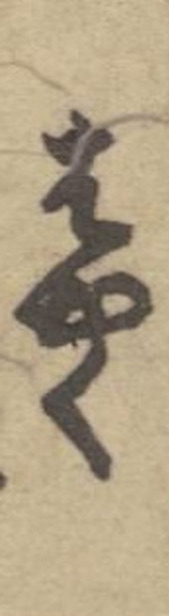はやく
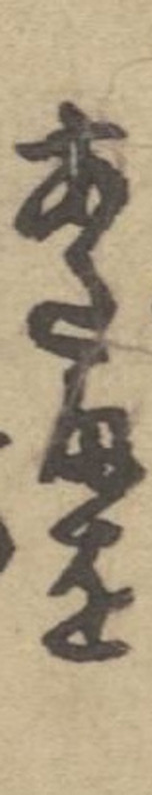あたまを
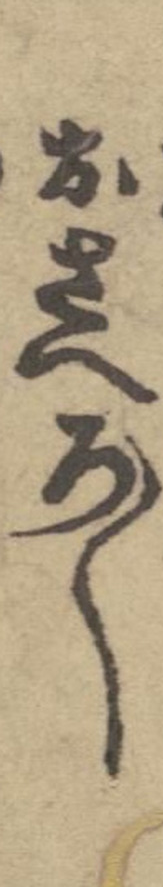おさへろ〳〵
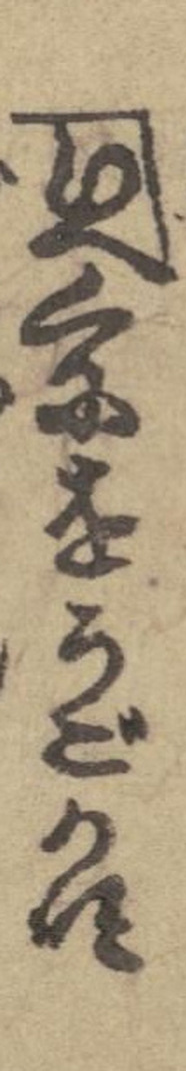〽いへくにをうごかす
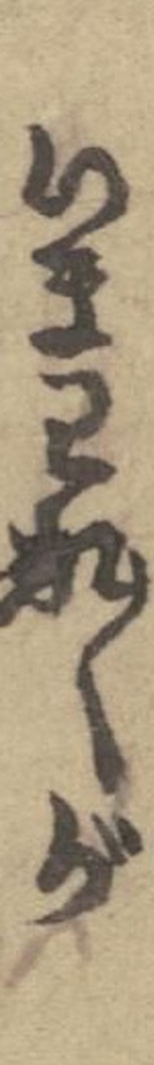いまわれ〳〵が
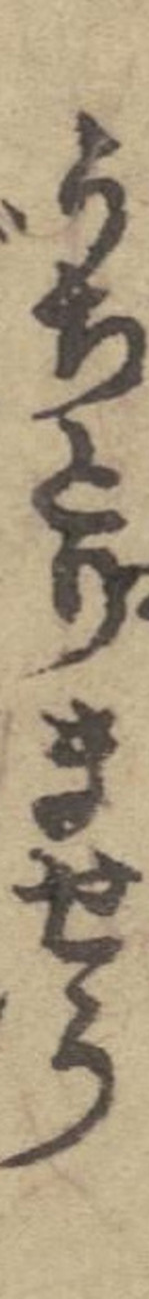うちとりませう
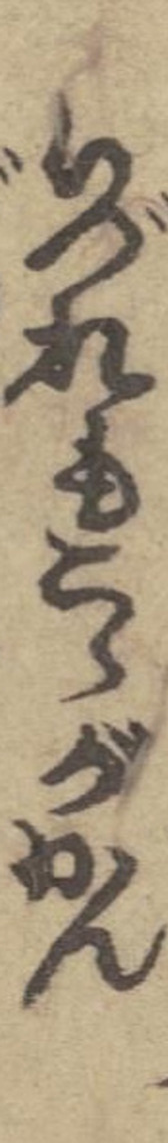いづれもこゝがかん
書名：入用御間商賣競
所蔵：東京大学地震研究所図書室 Earthquake Research Institute Library, The University of Tokyo, JAPAN
